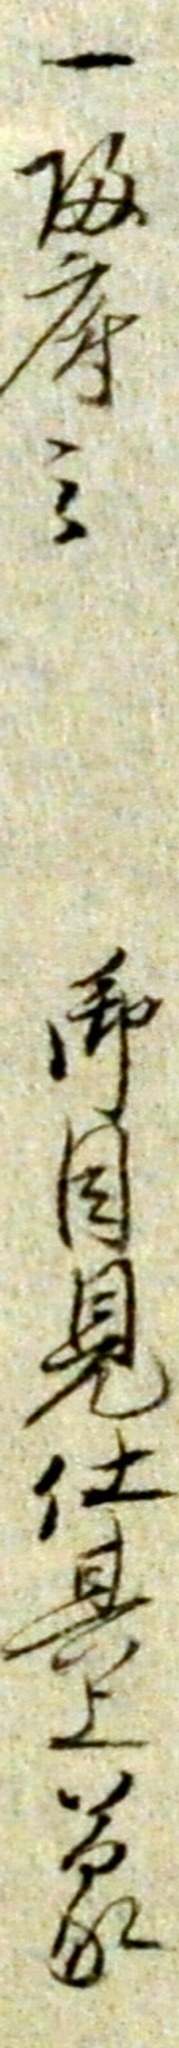一帰府之御目見仕其上蒙
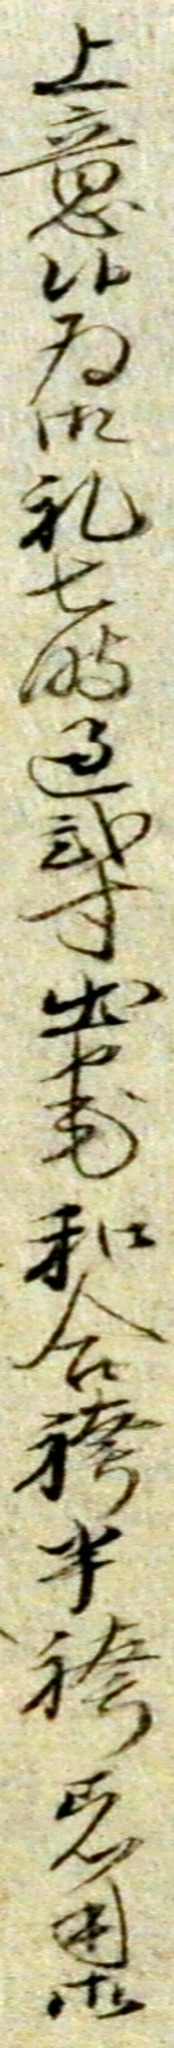上意候為御礼七時過弐寸出宅和合袴半袴着用御
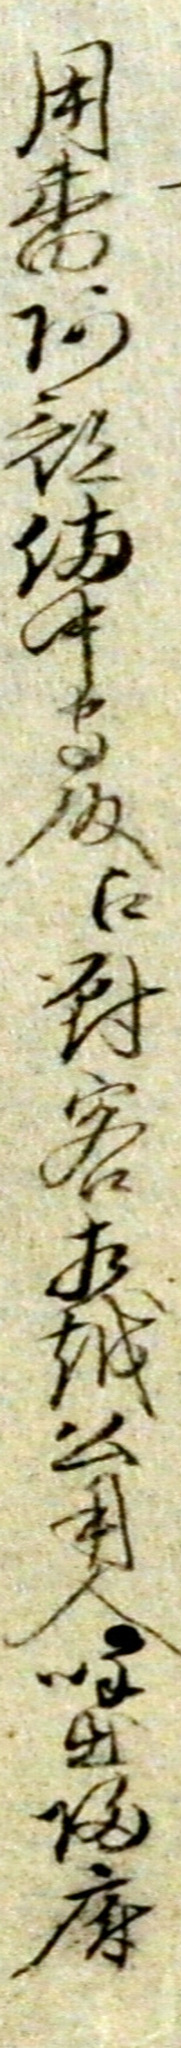用番阿部備中守殿江対客相越公用人呼出帰府
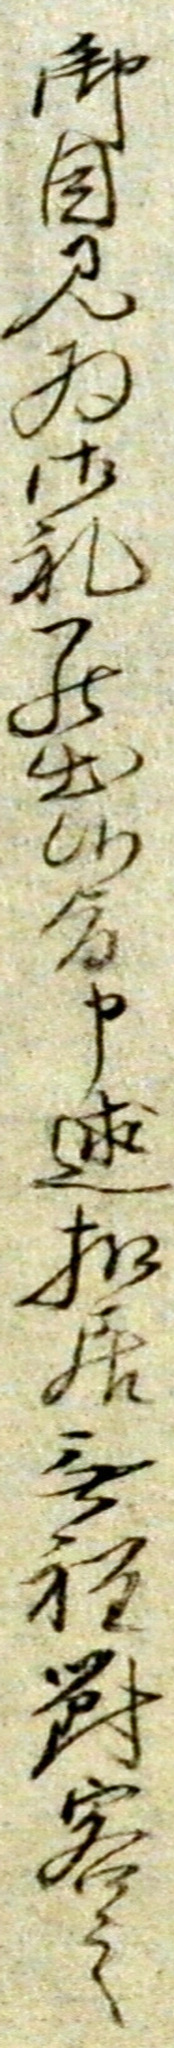御目見為御礼罷出候旨申述扣居無程対客之
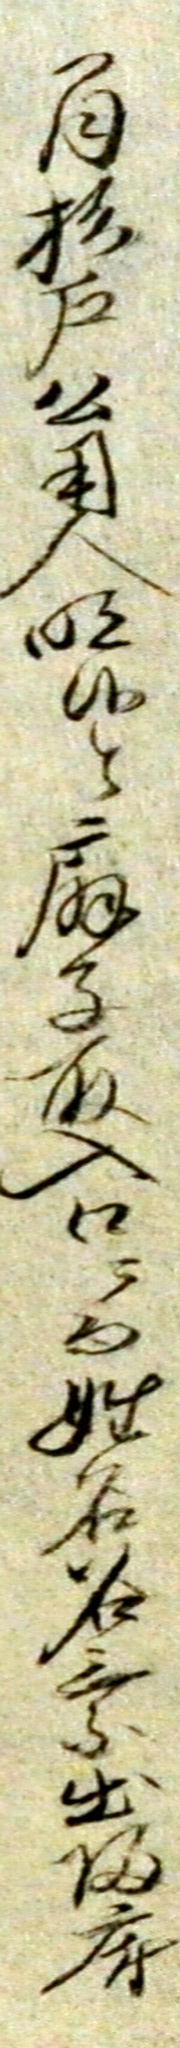間杉戸公用人明候と扇子取入口二而姓名名乗出帰府
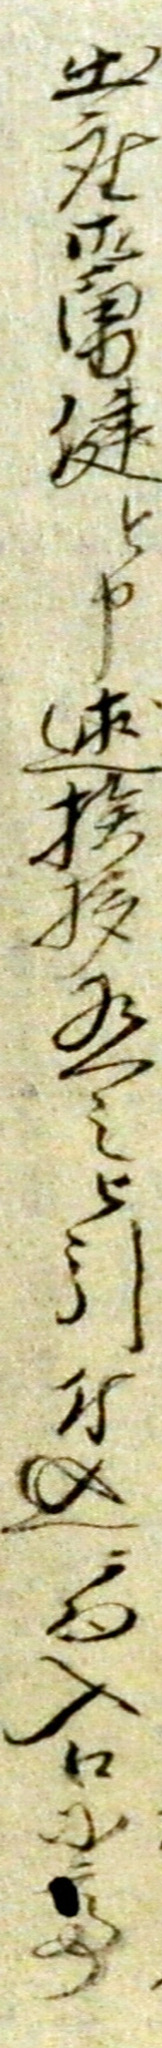出座御勇健と申述挨拶有之ヒ引付込二而入口尓亭
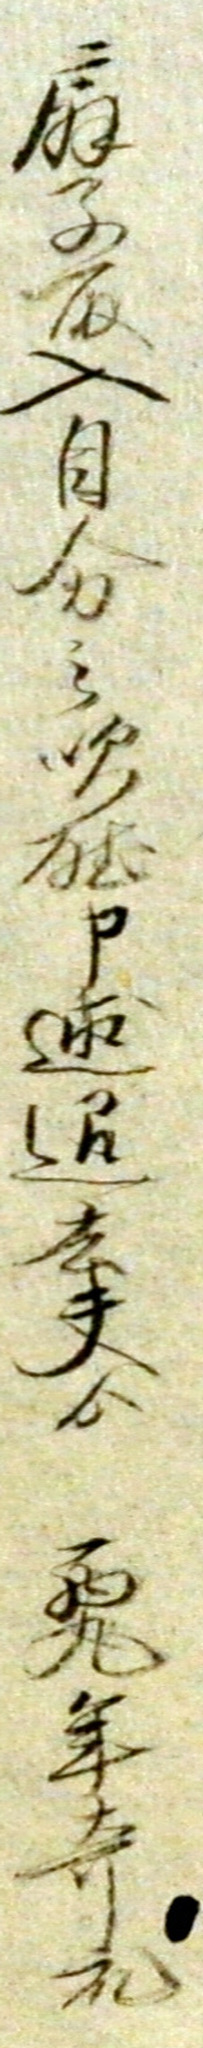扇子取入自分之吹聴申述退去夫ゟ西丸年寄衆
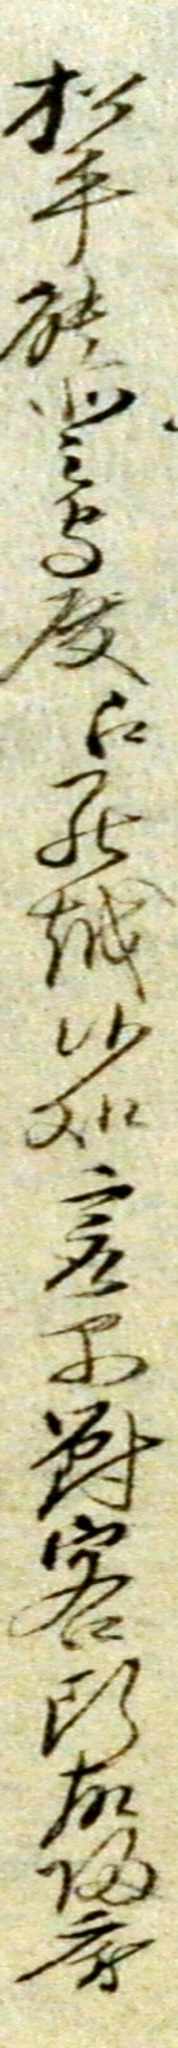松平能登守殿江罷越候処最早対客断故帰府
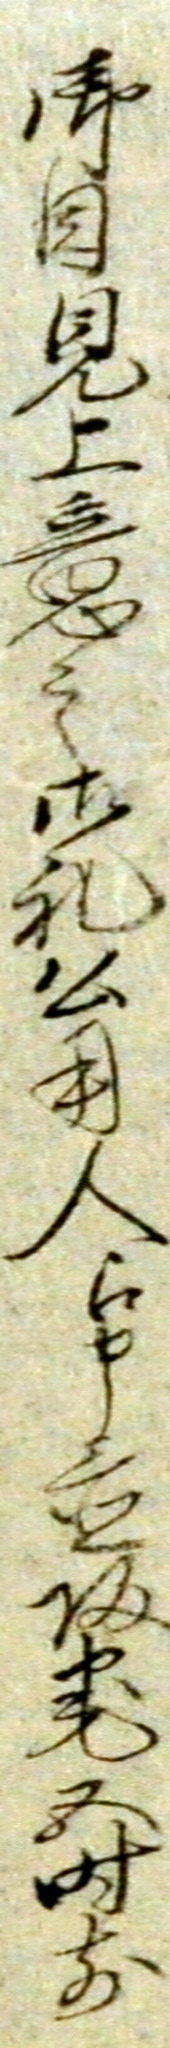御目見上意之御礼公用人江申置帰宅五時前
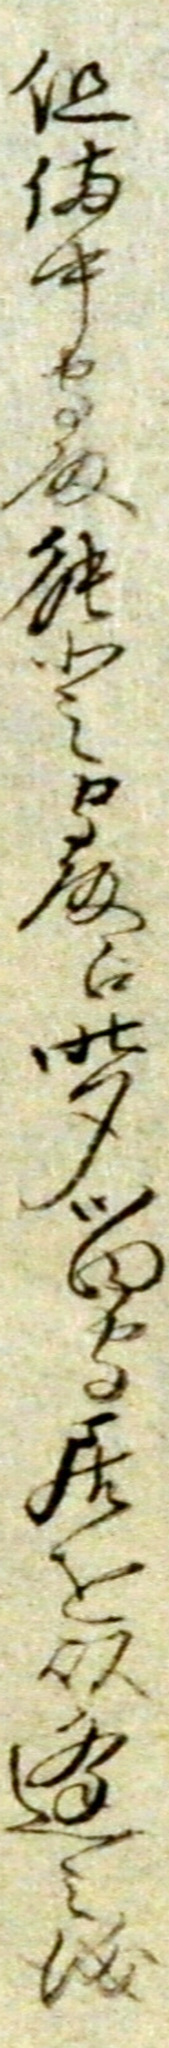但備中守殿能登守殿江昨夕留守居を以逢之儀
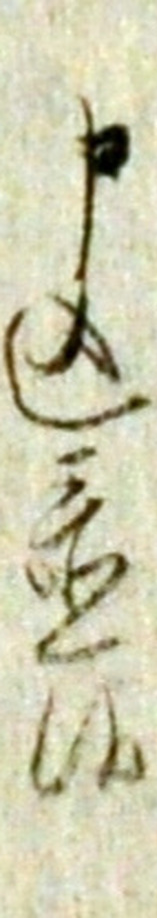申込置候

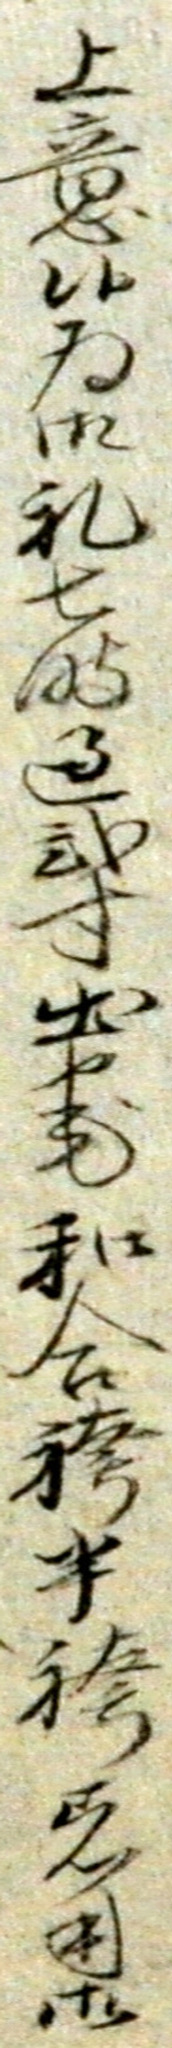上意候為御礼七時過弐寸出宅和合袴半袴着用御
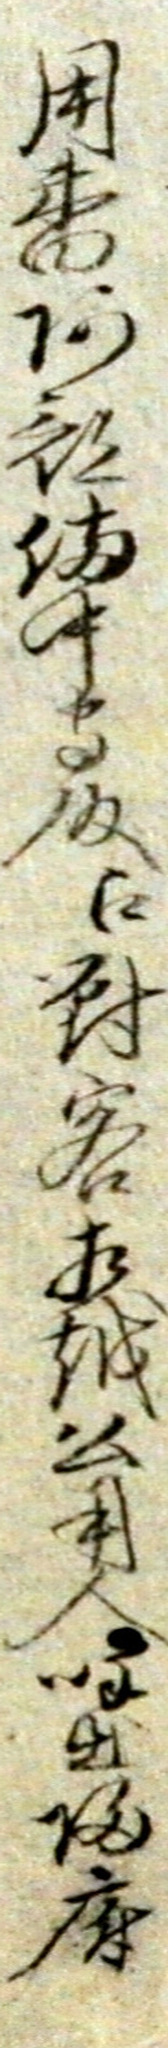用番阿部備中守殿江対客相越公用人呼出帰府
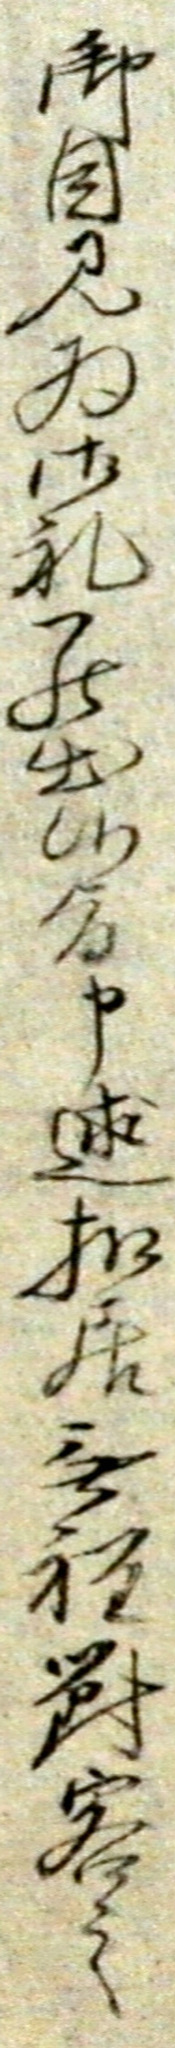御目見為御礼罷出候旨申述扣居無程対客之
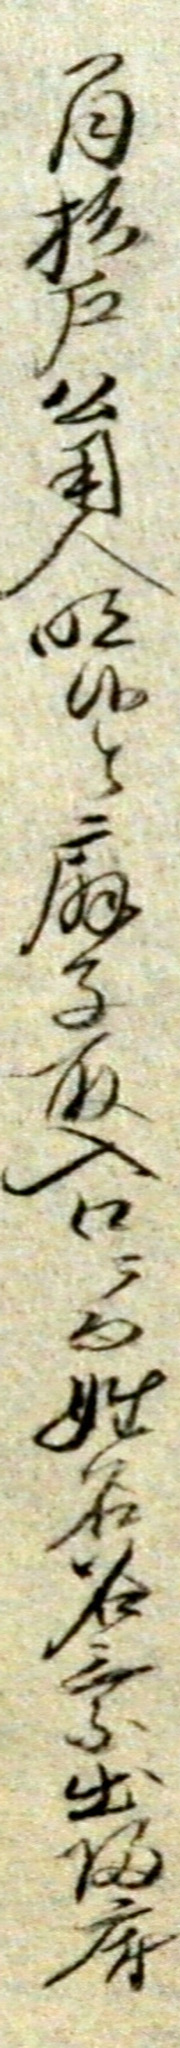間杉戸公用人明候と扇子取入口二而姓名名乗出帰府
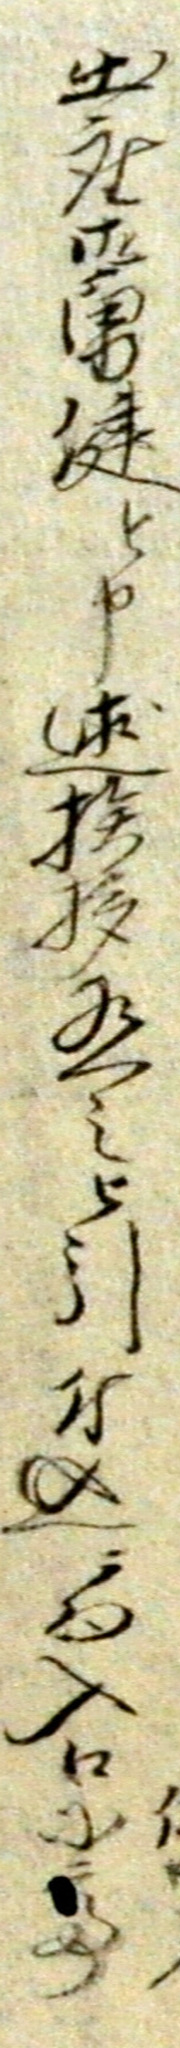出座御勇健と申述挨拶有之ヒ引付込二而入口尓亭
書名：日光御名代相勤候節ノ留
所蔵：伊那市立高遠町図書館・合同会社AMANE
